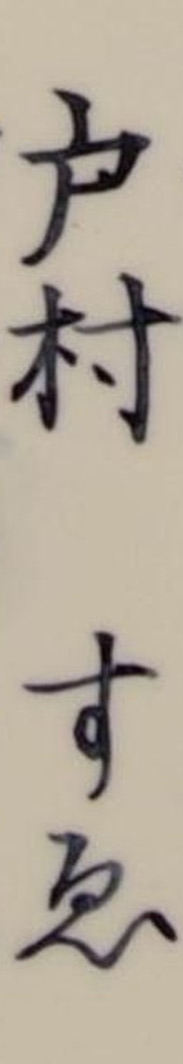戸村すえ
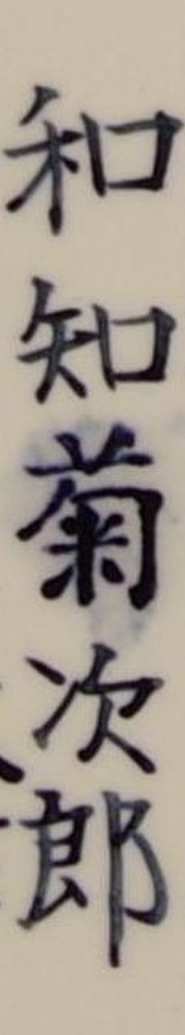和知菊次郎
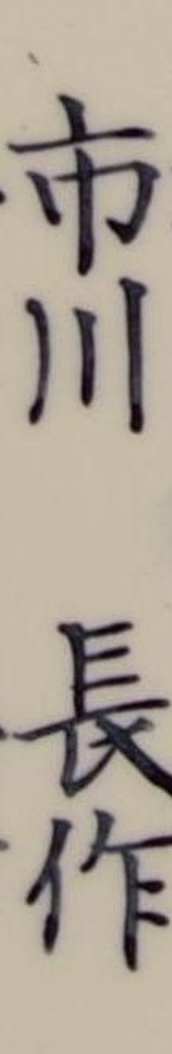市川長作
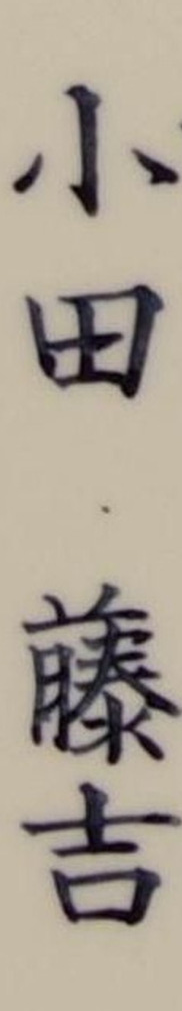小田藤吉
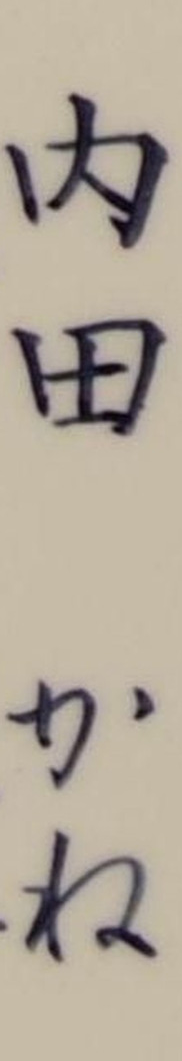内田かね
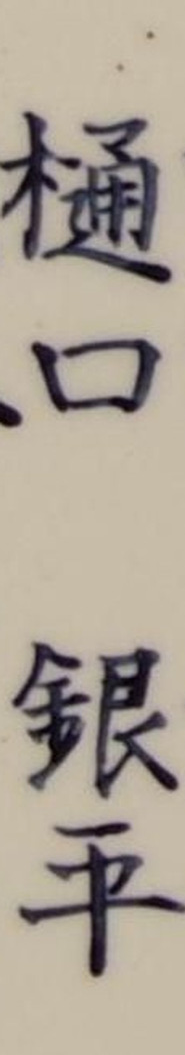樋口銀平
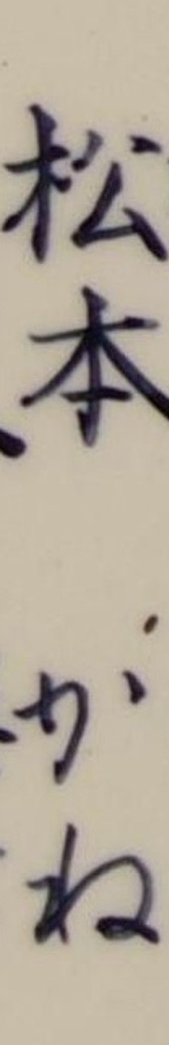松本かね
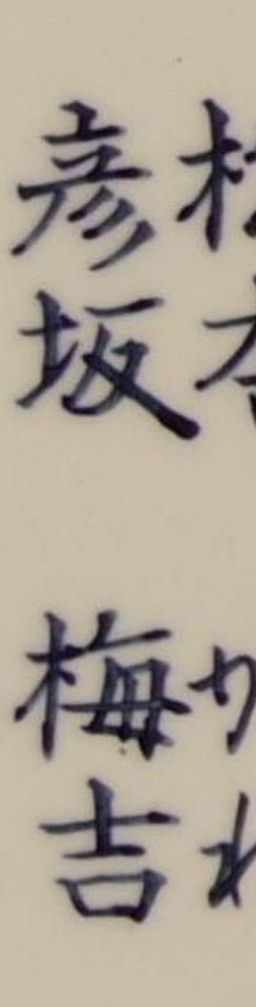彦坂梅吉

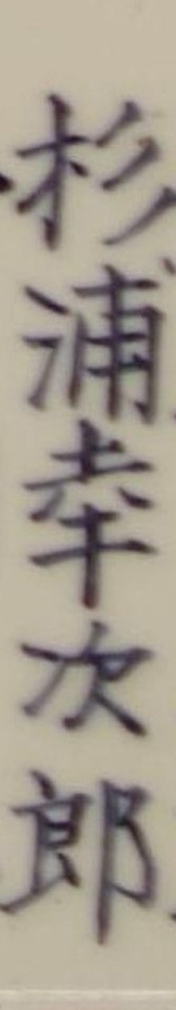杉浦幸次郎
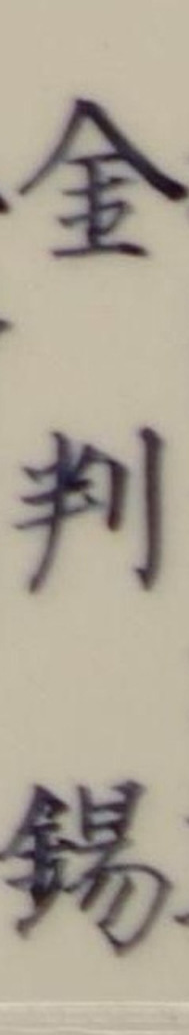金判錫
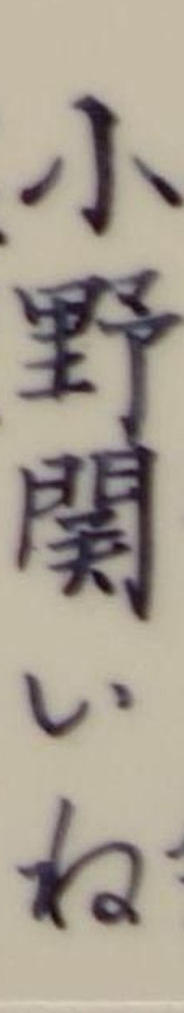小野関いね
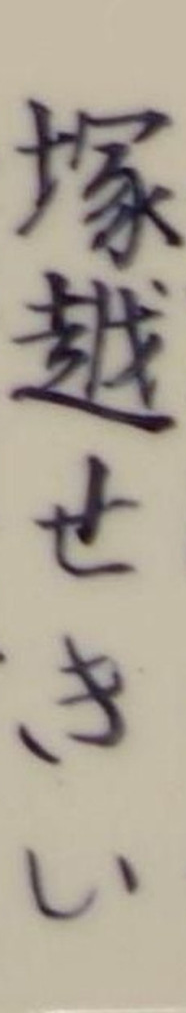塚越せきい
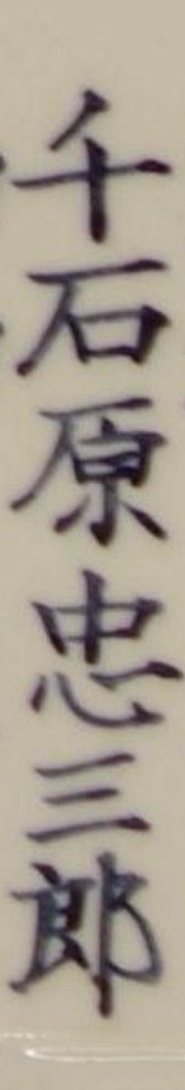千石原忠三郎
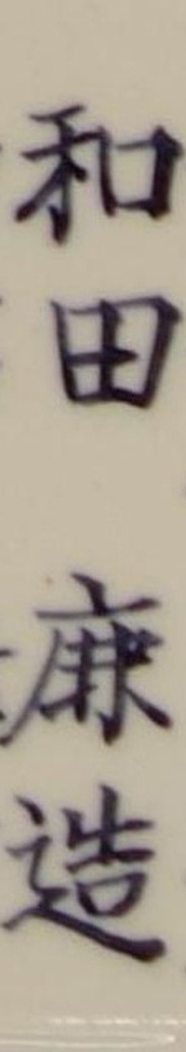和田兼造
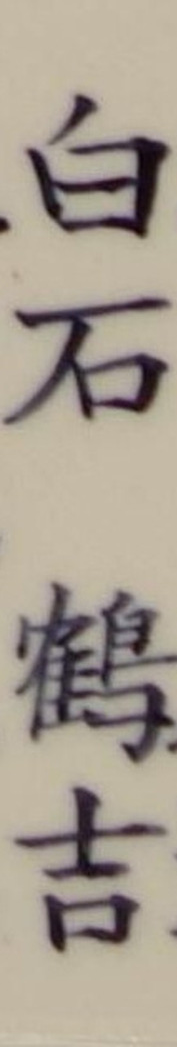白石鶴吉
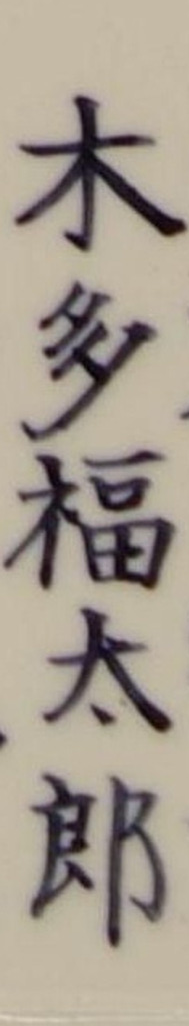木多福太郎
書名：M~S
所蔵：高野山金剛峯寺
